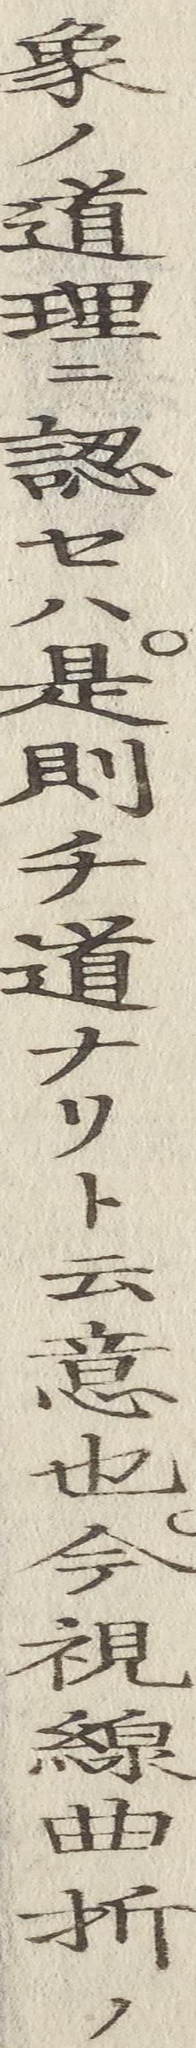象ノ道理ニ認セハ。是則チ道ナリト云意也。今視線曲折ノ
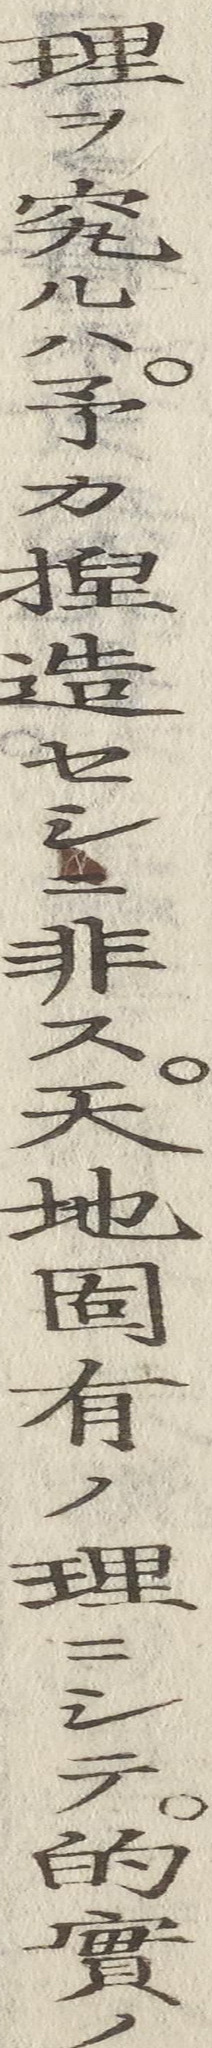理ヲ究ルハ。予カ捏造セシニ非ス。天地固有ノ理ニシテ。的実ノ
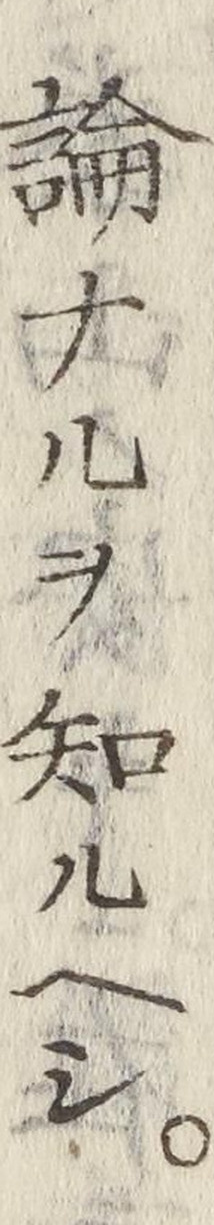論ナルヲ知ルヘシ。
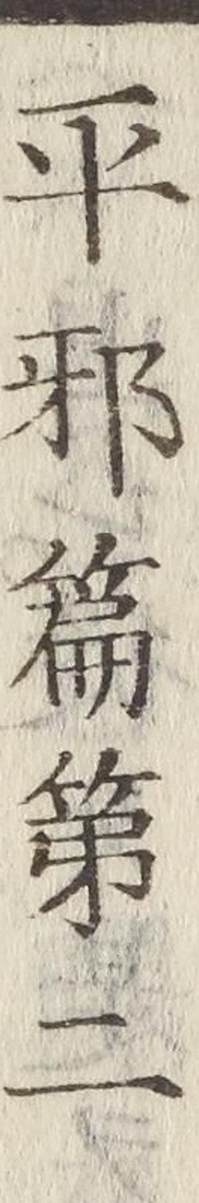平邪篇第二
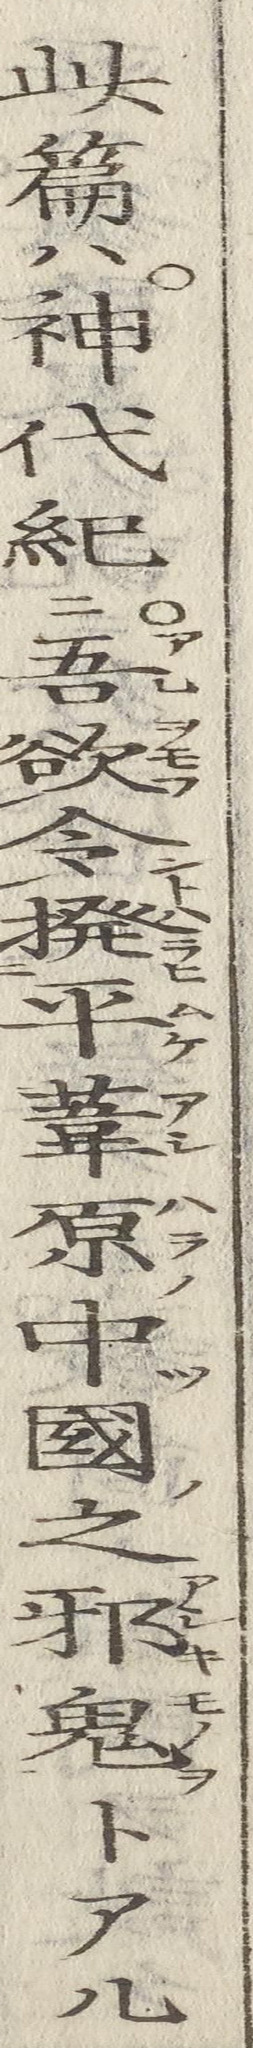此篇ハ。神代紀ニ。吾欲令撥平葦原中国之邪鬼トアル
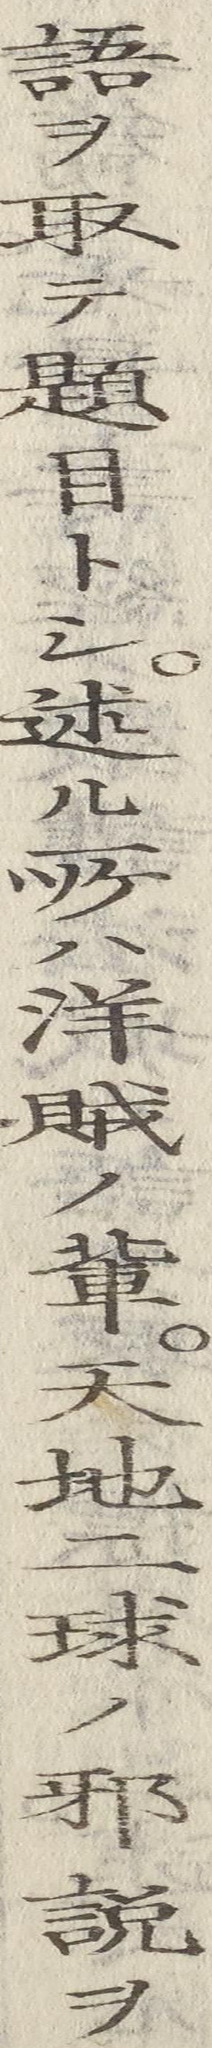語ヲ取テ題目トシ。述ル所ハ洋賊ノ輩。天地二球ノ邪説ヲ
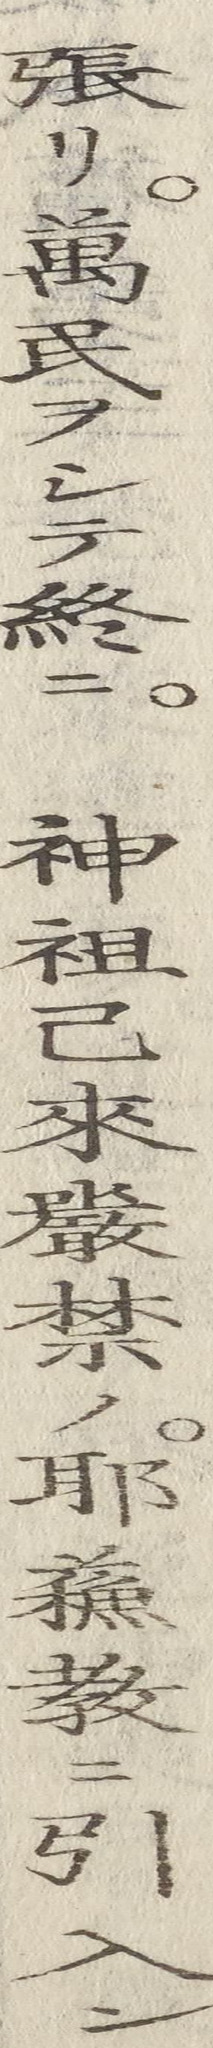張リ。万民ヲシテ終ニ。神祖己来厳禁ノ。耶蘇教ニ引入ン
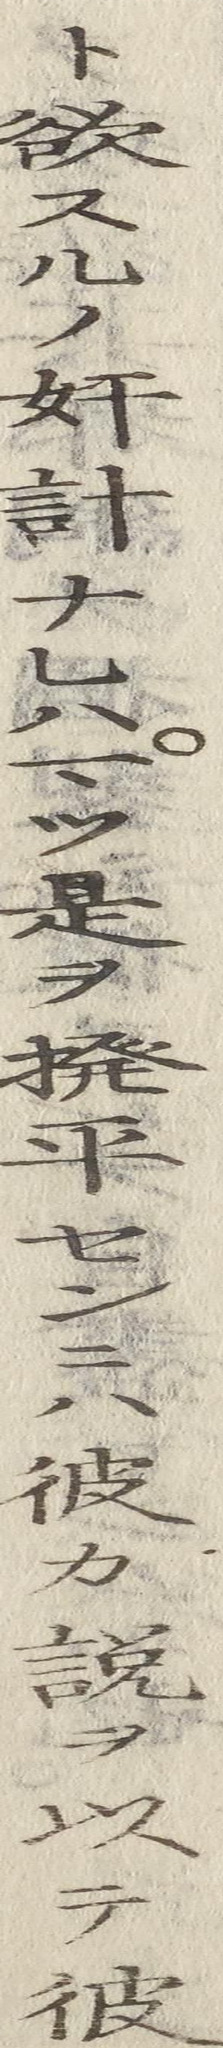ト欲スルノ奸計ナレハ。マツ是ヲ撥平センニハ彼カ説ヲ以テ彼

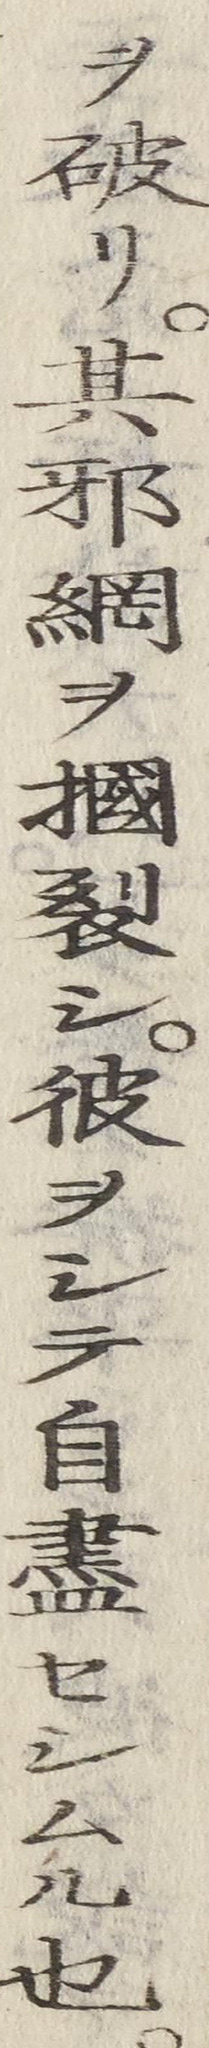ヲ破リ。其邪網ヲ掴裂シ。彼ヲシテ自尽セシムル也。
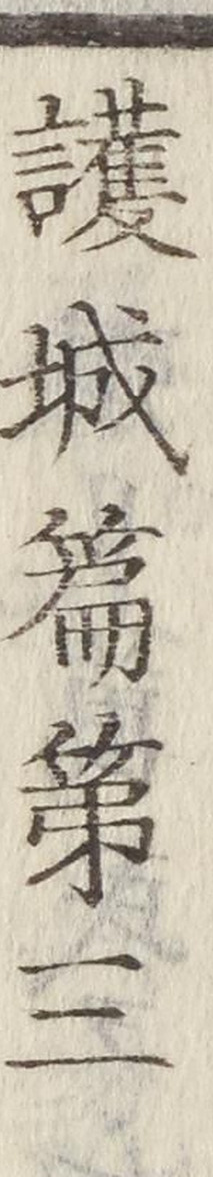護城篇第三
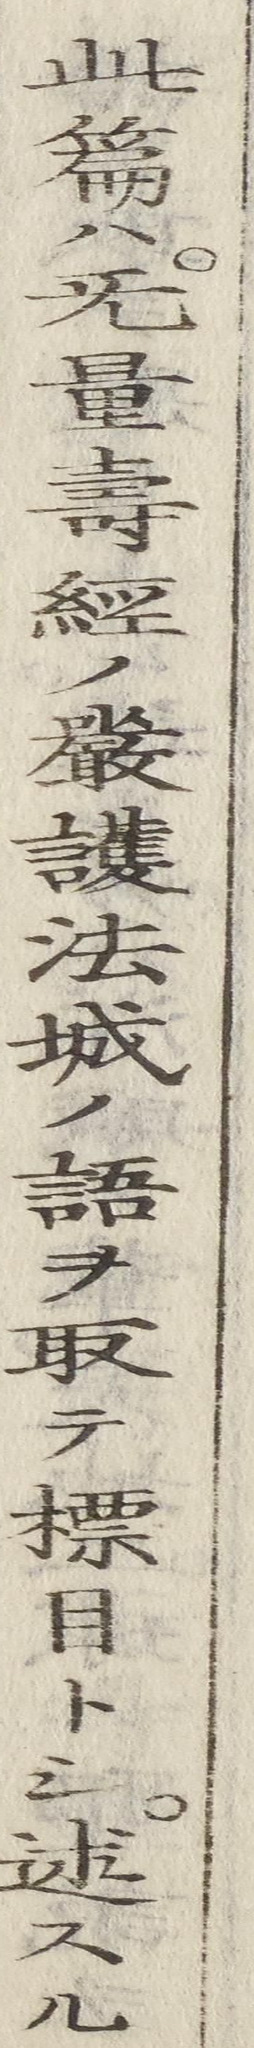此篇ハ無量寿経ノ厳護法城ノ語ヲ取テ標目トシ。述スル
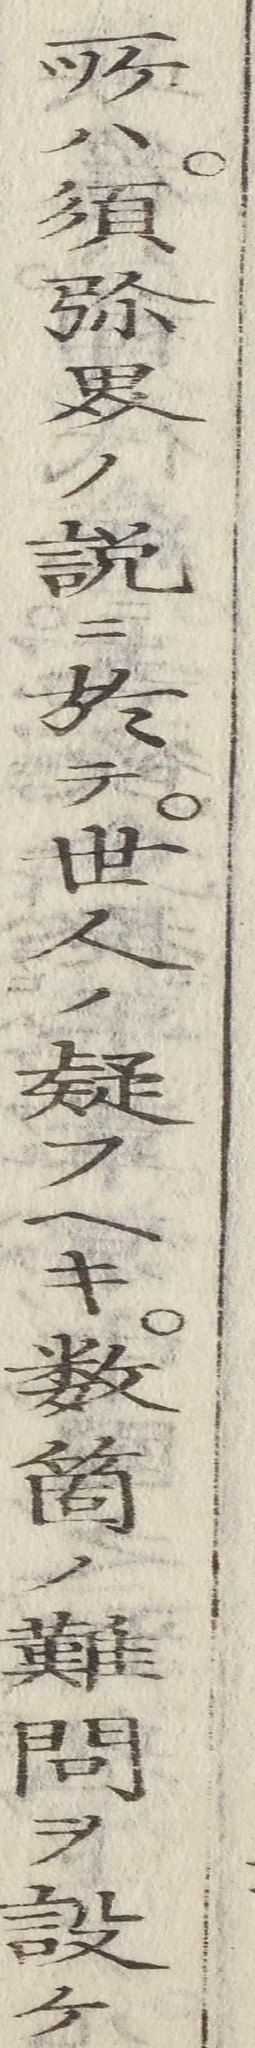所ハ。須弥界ノ説ニ於テ。世人ノ疑フヘキ。数箇ノ難問ヲ設ケ
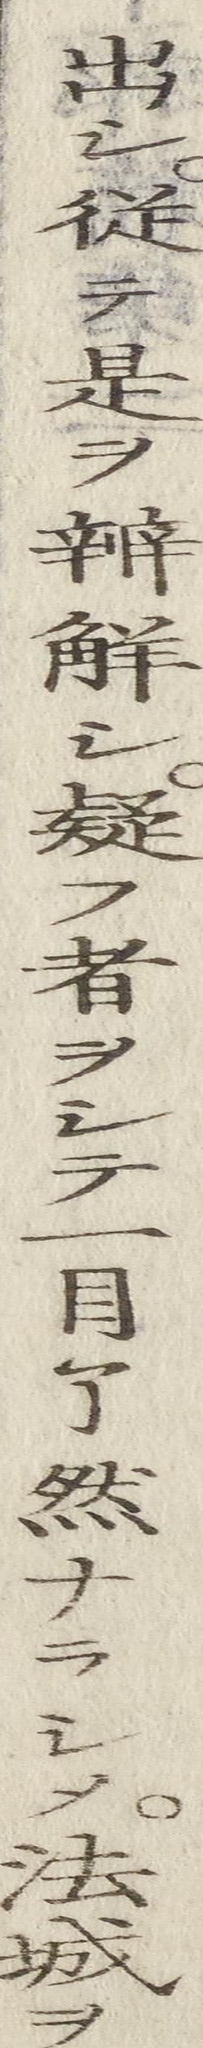出シ。従テ是ヲ弁解シ。疑フ者ヲシテ一目了然ナラシメ。法城ヲ
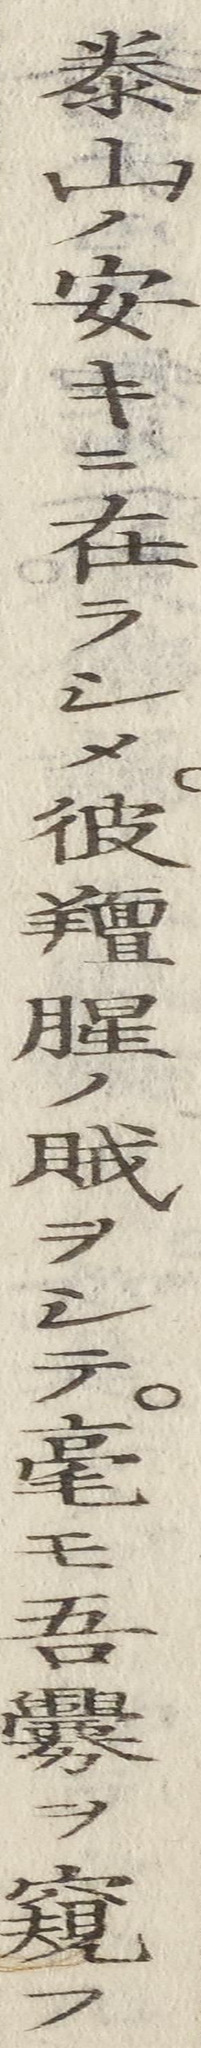泰山ノ安キニ在ラシメ。彼羶暒ノ賊ヲシテ。毫モ吾釁ヲ窺フ
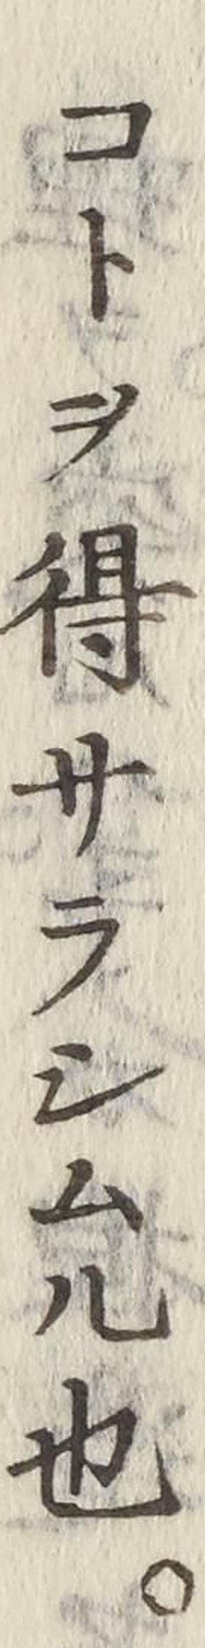コトヲ得サラシムル也。
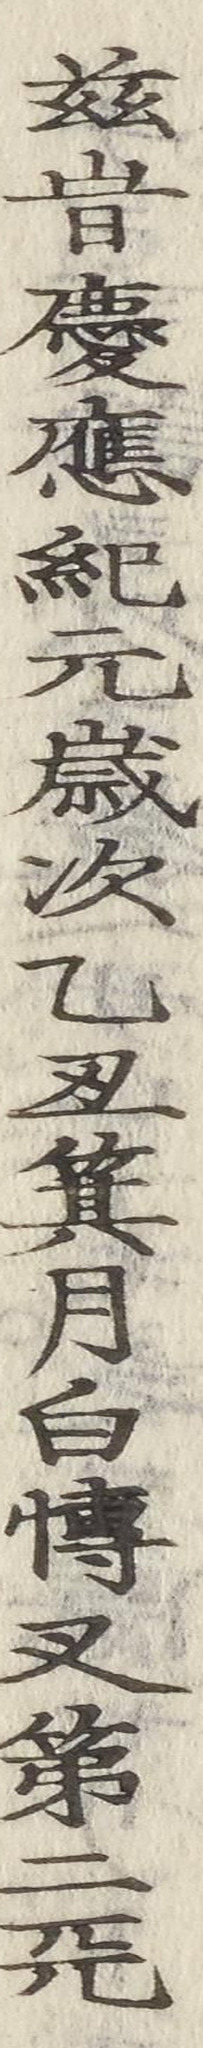茲旹慶応紀元歳次乙丑箕月白愽叉第二兀兀
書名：護法新論　上
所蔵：東京大学地震研究所図書室 Earthquake Research Institute Library, The University of Tokyo, JAPAN
